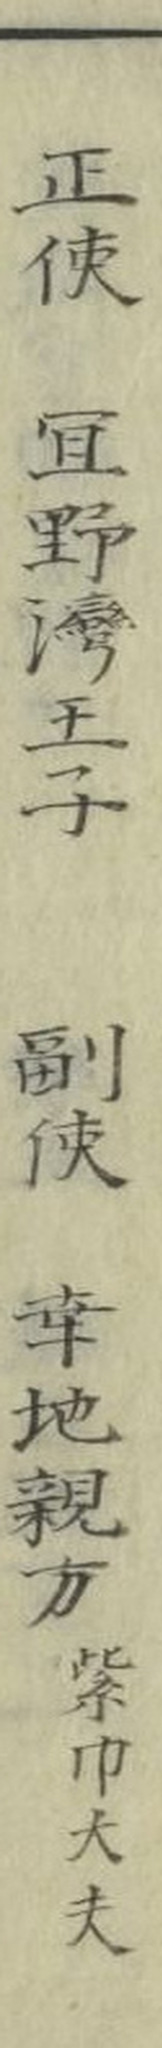正使宜野湾王子副使幸地親方紫巾大夫

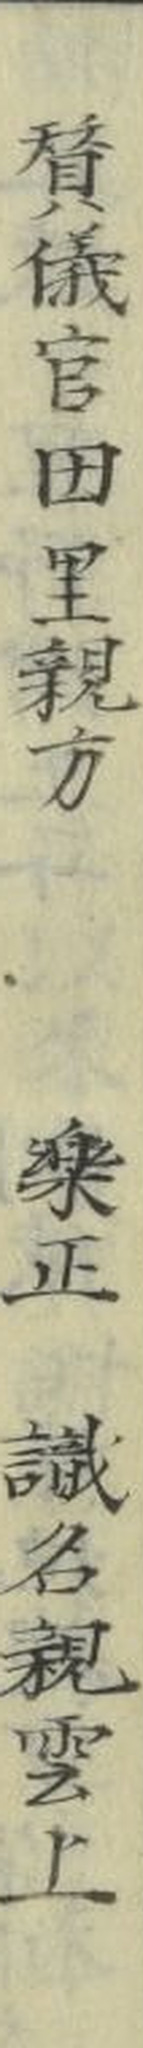賛儀官田里親方楽正識名親雲上
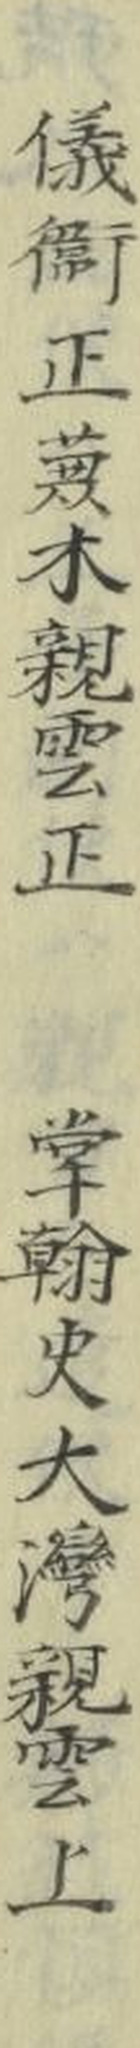儀衞正木親雲正掌翰史大湾親雲上
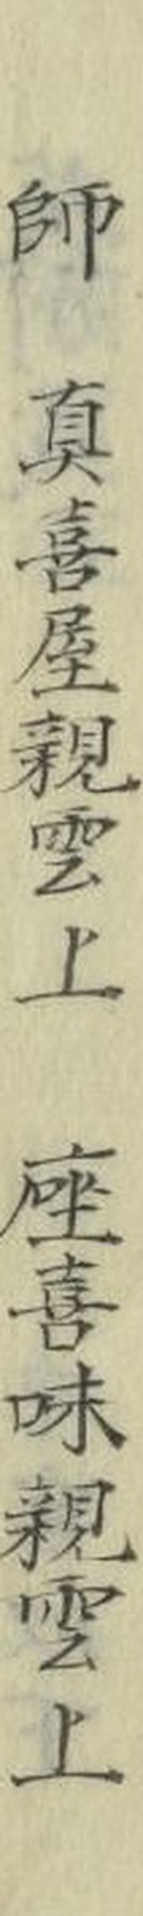師真喜屋親雲上座喜味親雲上
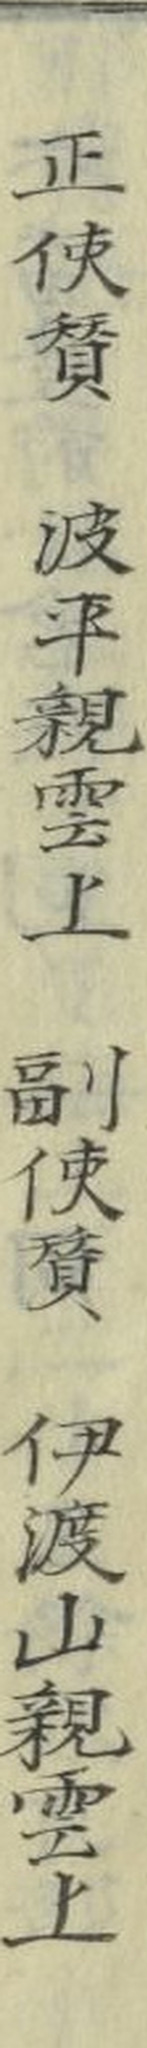正使賛波平親雲上副使賛伊渡山親雲上
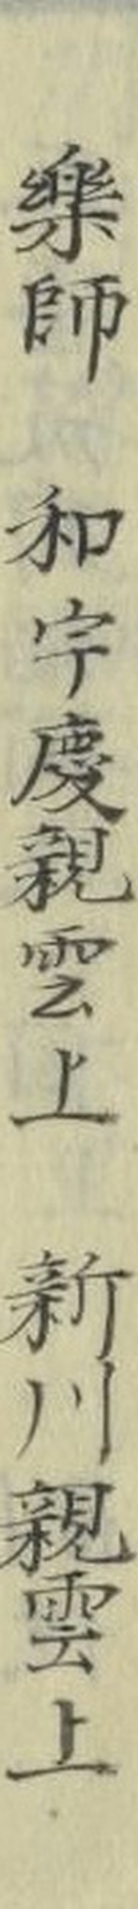楽師和宇慶親雲上新川親雲上
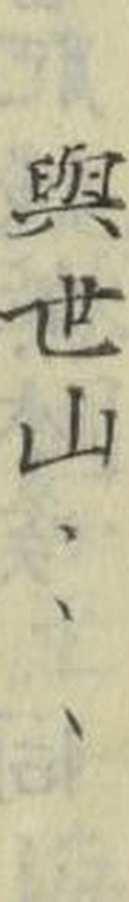与世山ヽヽヽ
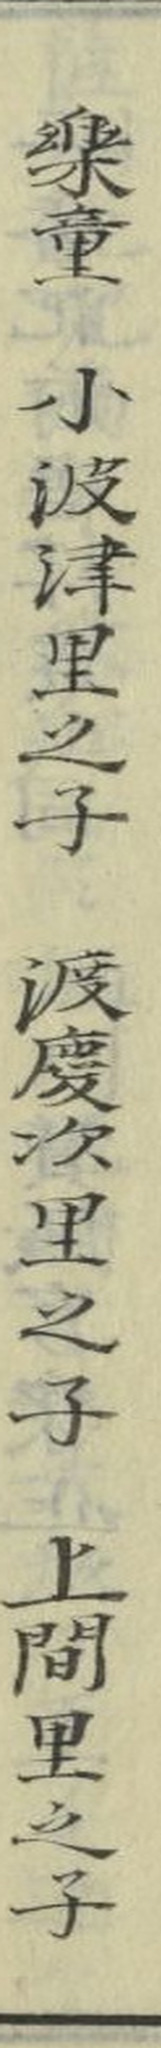楽童小波津里之子渡慶次里之子上間里之子
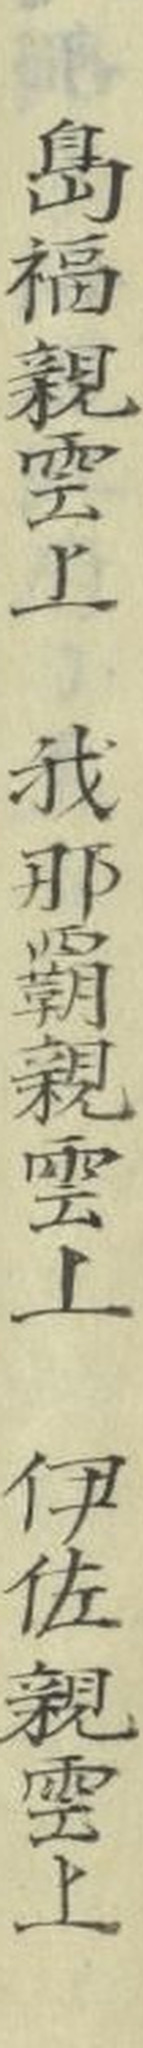島福親雲上我那覇親雲上伊佐親雲上
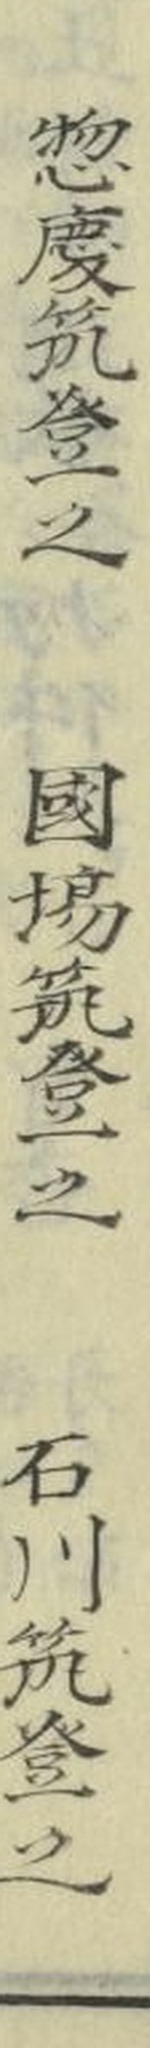惣慶筑登之国場筑登之石川筑登之

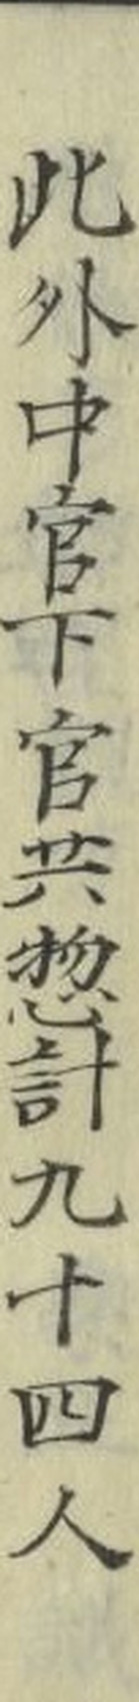此外中官下官共惣計九十四人
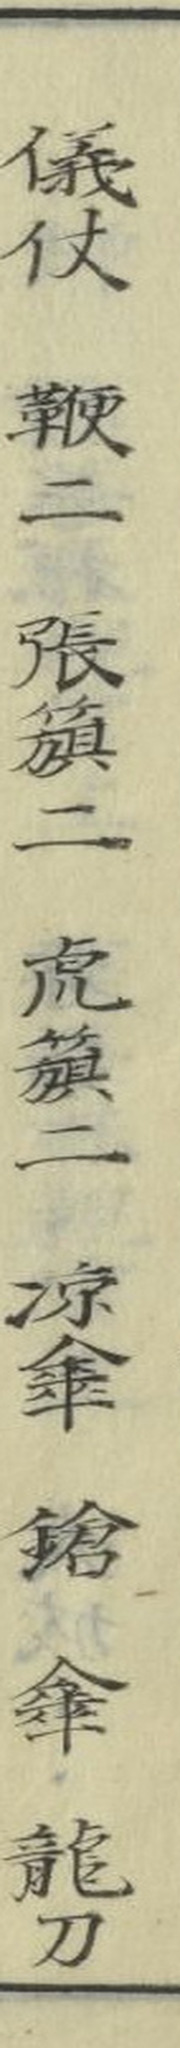儀仗鞭二張簱二虎簱二凉傘鎗傘龍刀
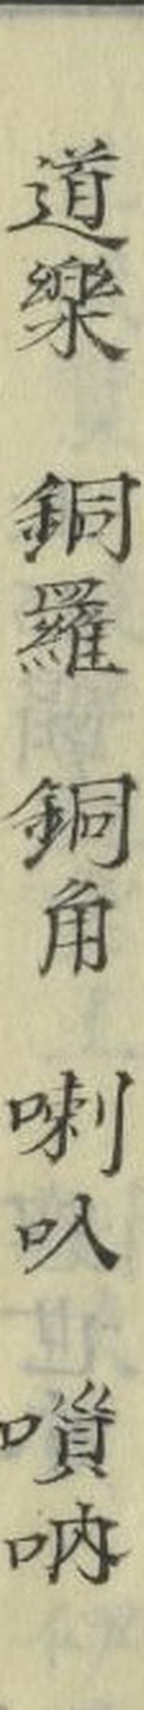道楽銅羅銅角喇叺嗩吶
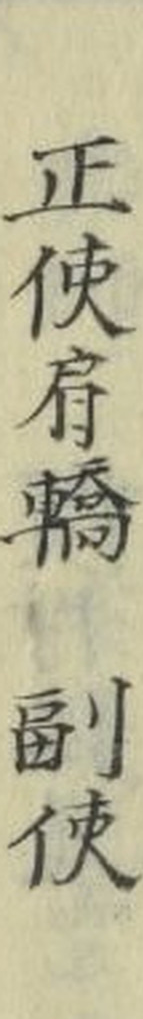正使肩轎副使
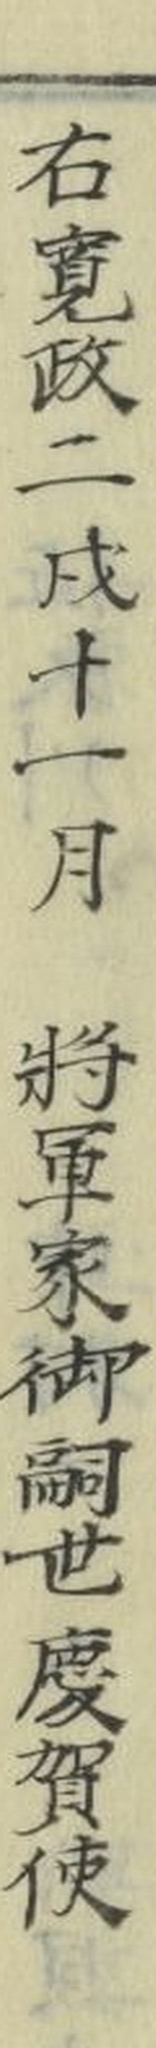右寛政二戌十一月将軍家御嗣世慶賀使
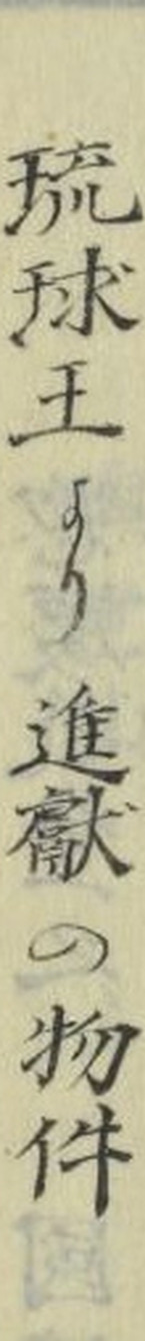琉球王より進献の物件
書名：琉球沿革志 下
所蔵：University of the Ryukyus Library
